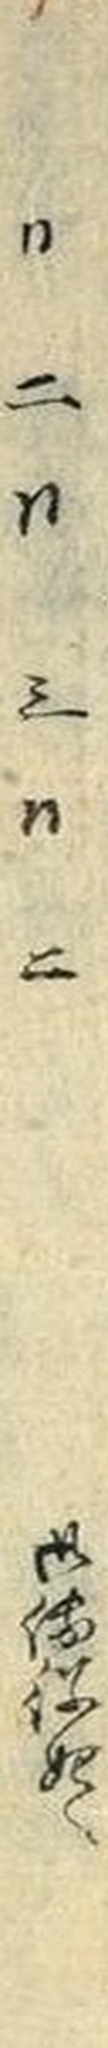同二同三同二御傅役始へ
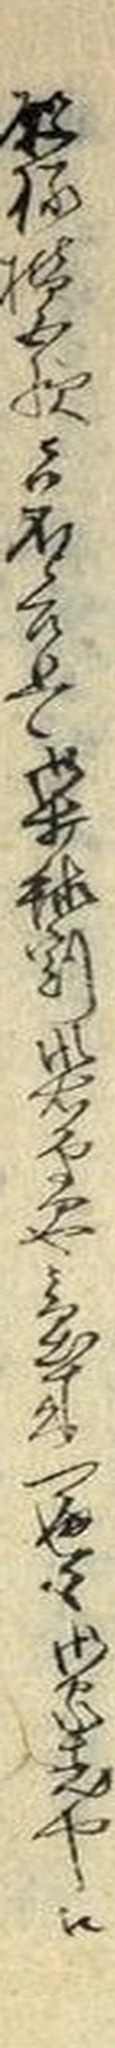殿様揩五郎様ニハ不召上候御打毬割御右筆部やニ而出来一通ツゝ御家老中江
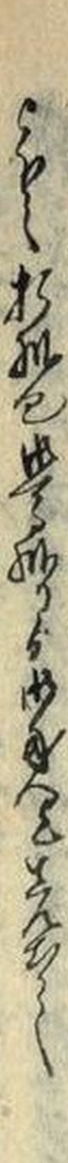被下之折机包御馬掛りゟ御用人迄差出之
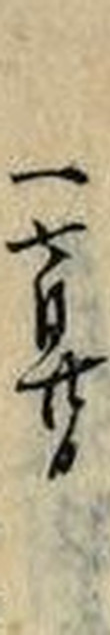一七月廿日
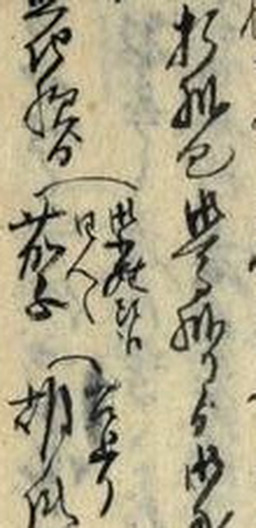御小姓頭取
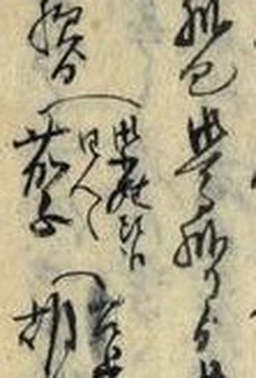御小姓頭取

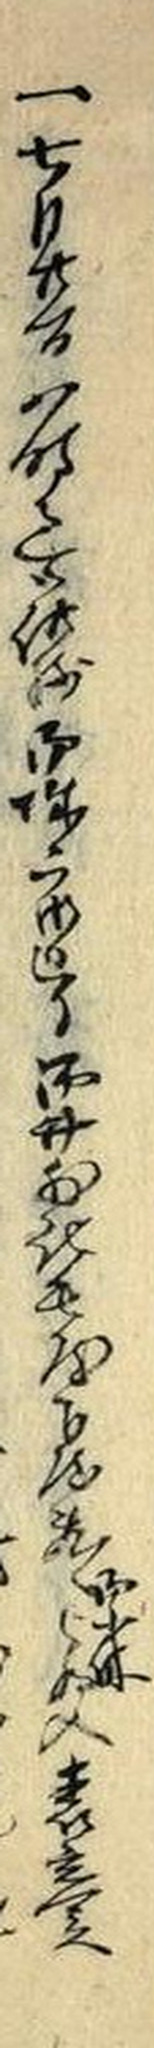一七月廿一日八時過御供揃御城下御廻り酒井外記長屋下屋敷御小休被為入表玄関
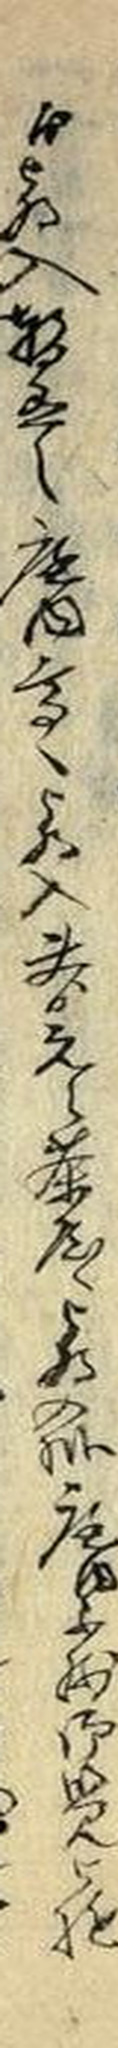ゟ被為入暫有之庭内亭へ被為入夫ゟ元之茶屋へ被為入掛庭内不残御覧被遊
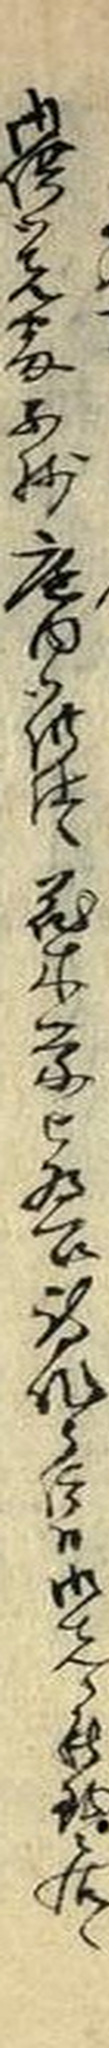御供御先番不残庭内御供仕候花木栄被為召詩作被仰付御先ニ罷越居候
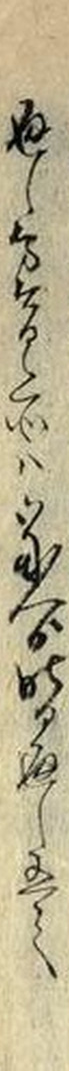通し方今日之所ハ御用人ゟ昨日通し有之
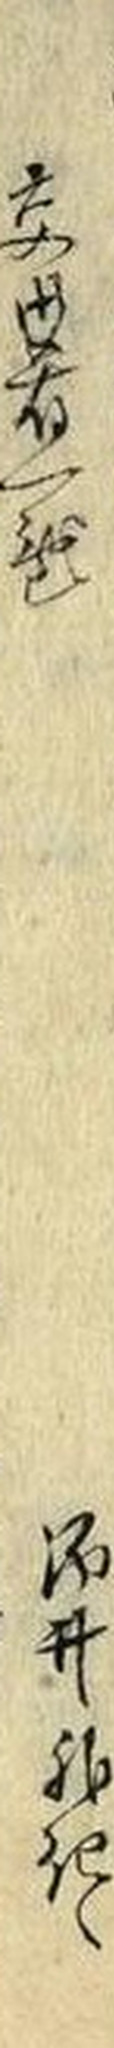交御肴一台酒井外記へ
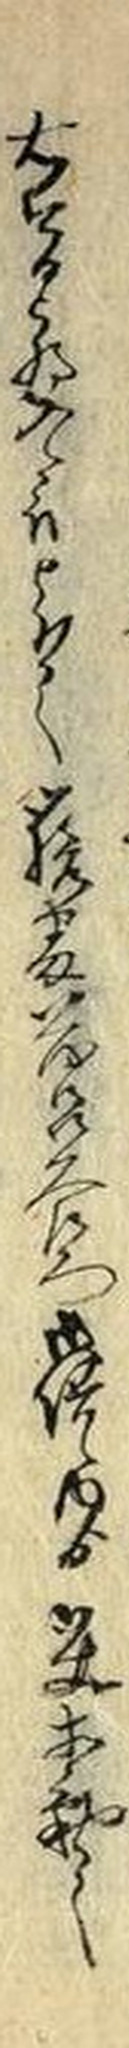右今日被為入候ニ付被下之御膳番茂呂久左衛門御供之内ゟ御使相勤之
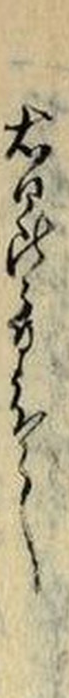右同断ニ付被下之
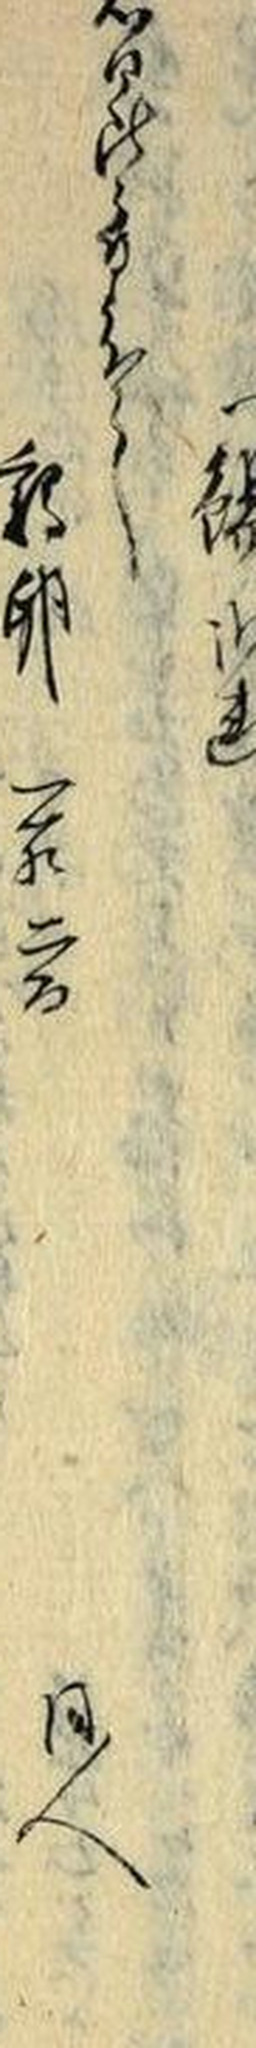鶉卵一箱二百同人
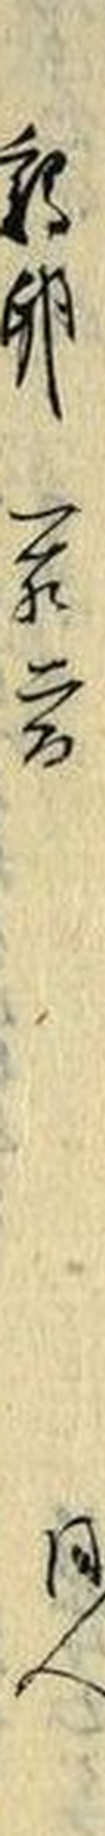鶉卵一箱二百同人
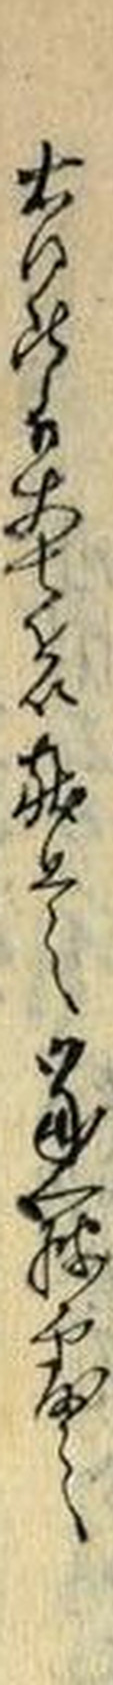右同断ニ付使者を以献上之御用人披露之
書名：少傅日録抄（斉承付側向頭取日記、在国）
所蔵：福井県文書館 Fukui Prefectural Archives
